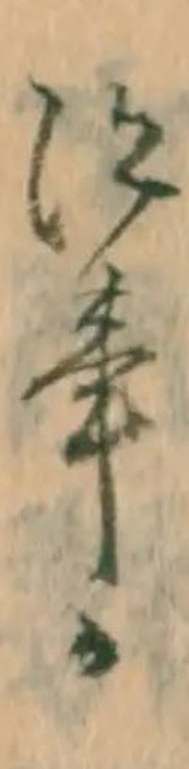注事か
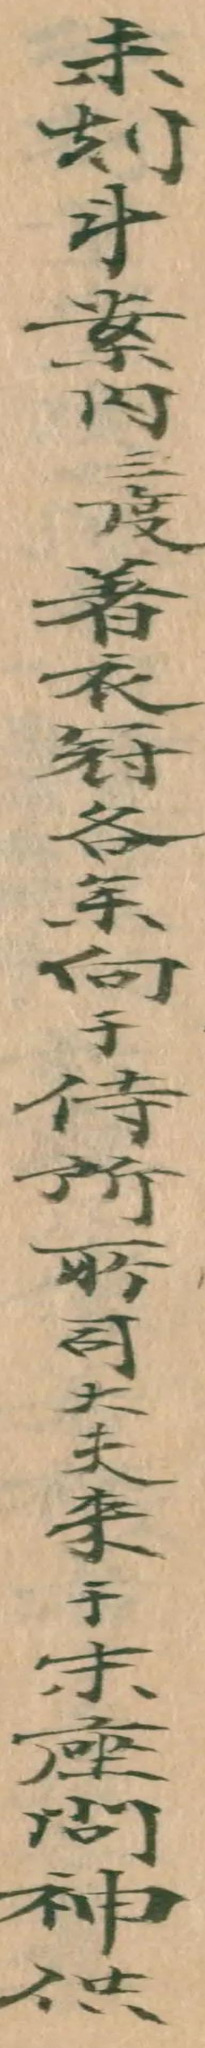未刻計案内三度着衣冠各参向于侍所所司大夫来于末座問神供
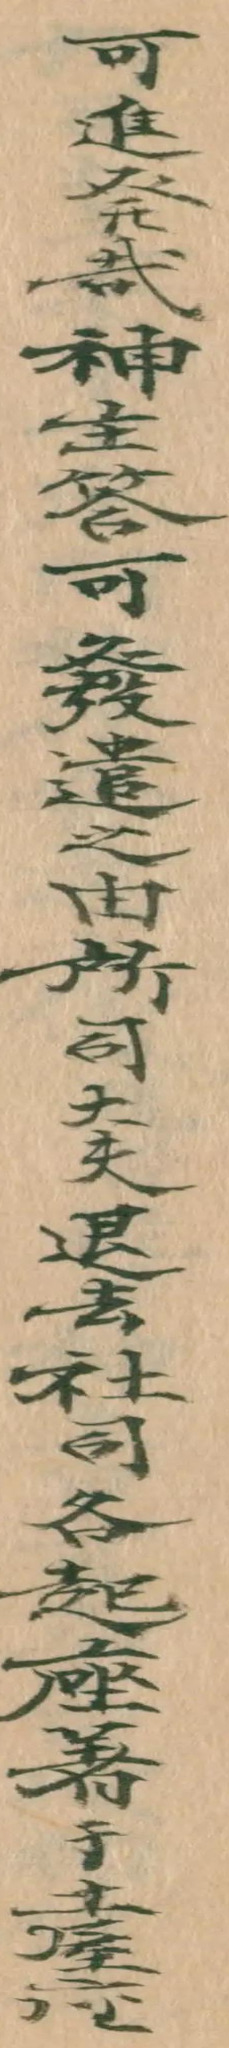可進発哉神主答可発遣之由所司大夫退去社司各起座着手土屋座
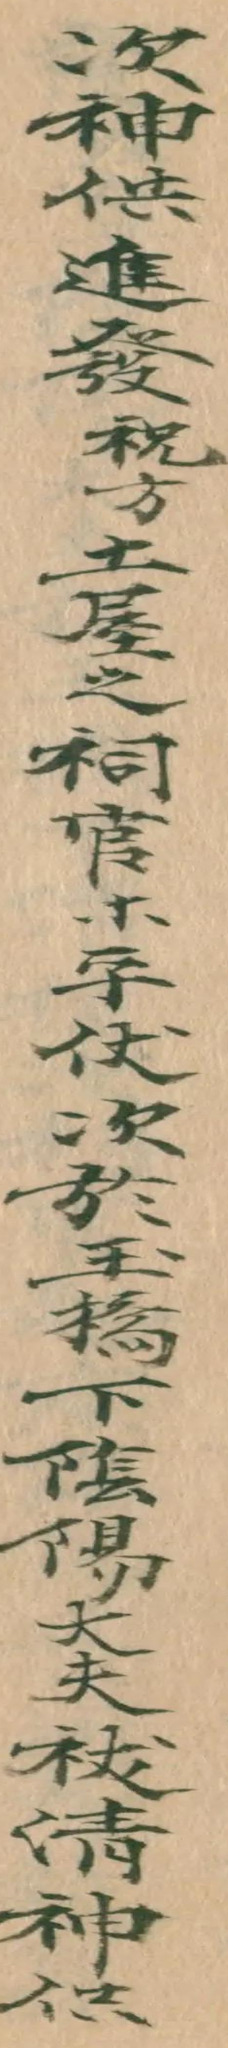次神供進発祝方土屋之祠官等平伏次於玉橋下陰陽大夫祓清神供
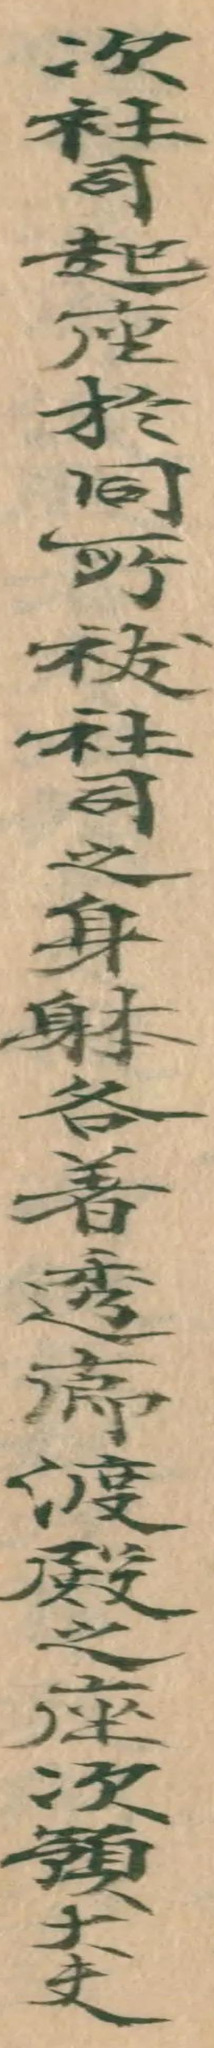次社司起座於同所祓社司之身体各着透廊渡殿之座次預大夫
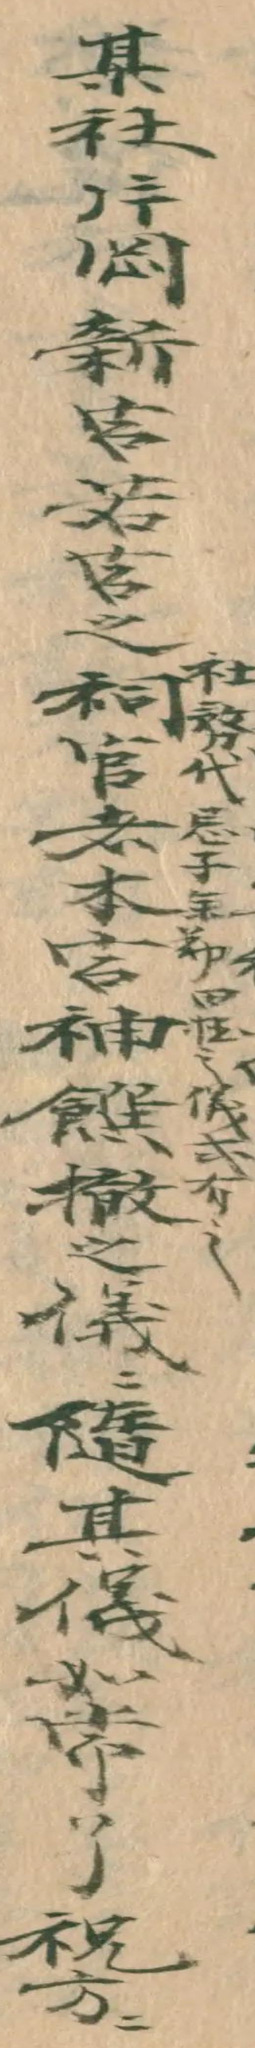某社片岡新宮若宮之祠官者本宮神撰撤之儀ニ随其儀如常了祝方ニ
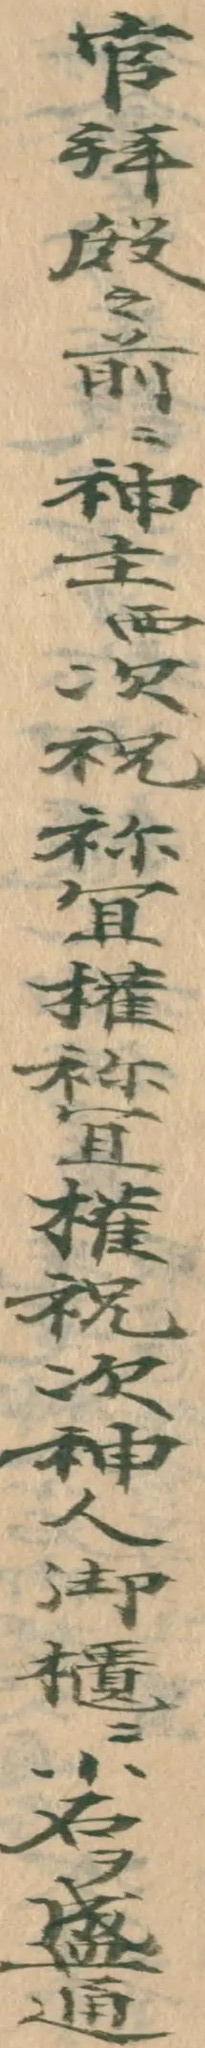官拝殿之前ニ神主西次祝禰宜権禰宜権祝次神人御櫃ニ小石ヲ盛通
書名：賀茂社記録. 第5冊
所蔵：国立国会図書館 National Diet Library, JAPAN
